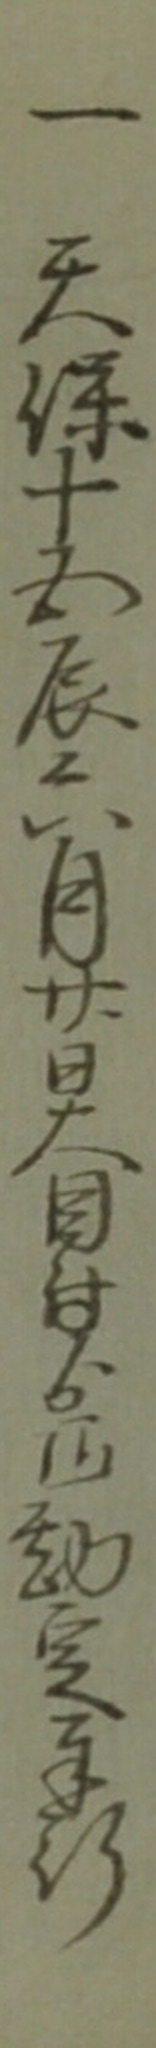一天保十五辰六月廿日大目付ゟ御勘定奉行
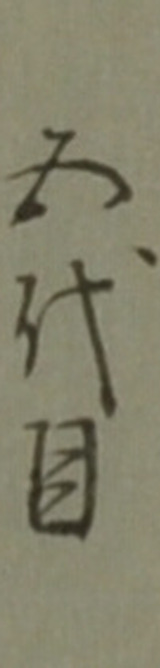五代目
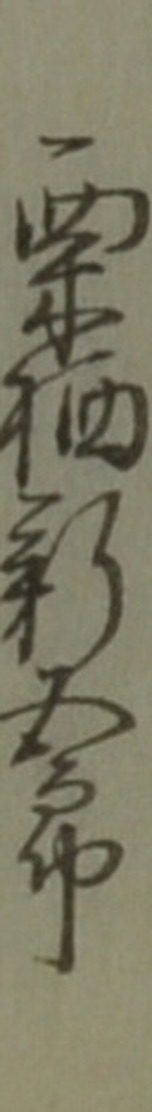栗栖新五郎
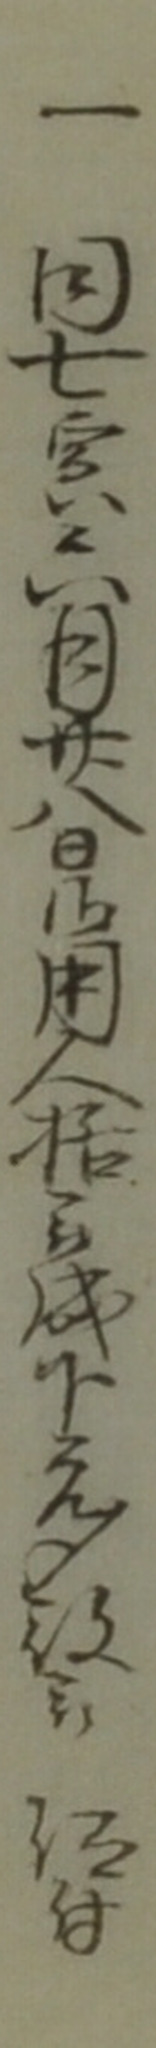一同七寅六月廿八日御用人格被成下元〆役被仰付
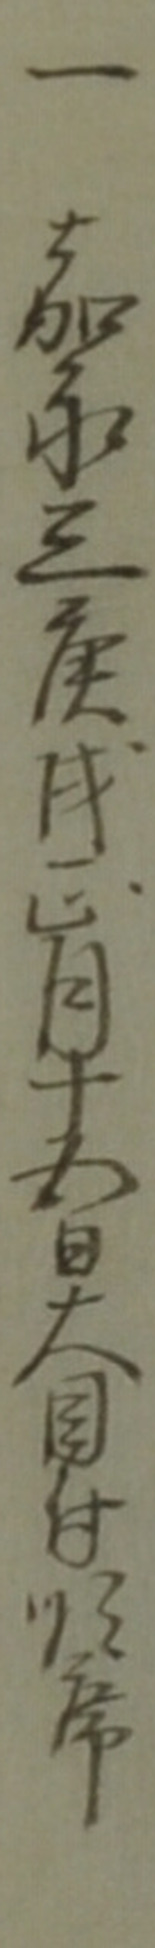一嘉永三庚戌正月十五日大目付順席
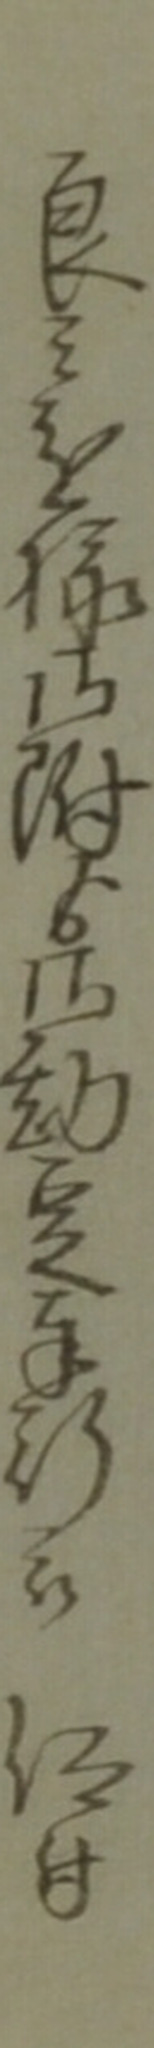良之進様御附ゟ御勘定奉行被仰付
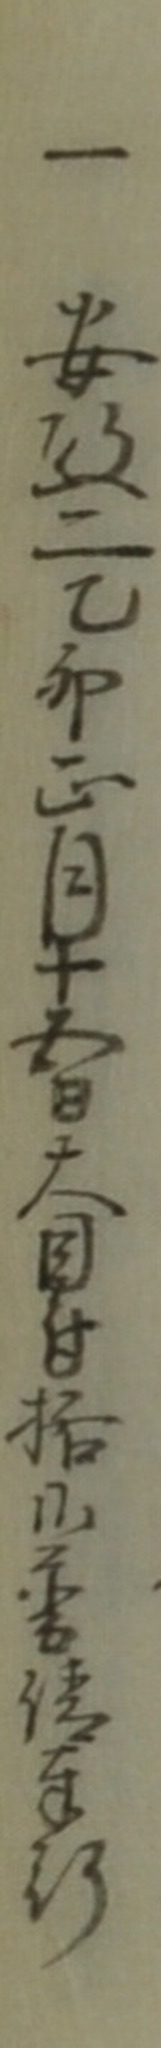一安政二乙卯正月十五日大目付格御普請奉行
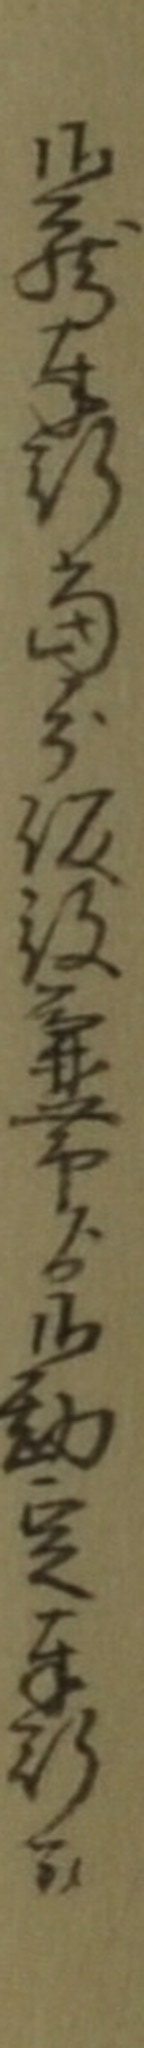御蔵奉行当分仮役兼帯ゟ御勘定奉行被
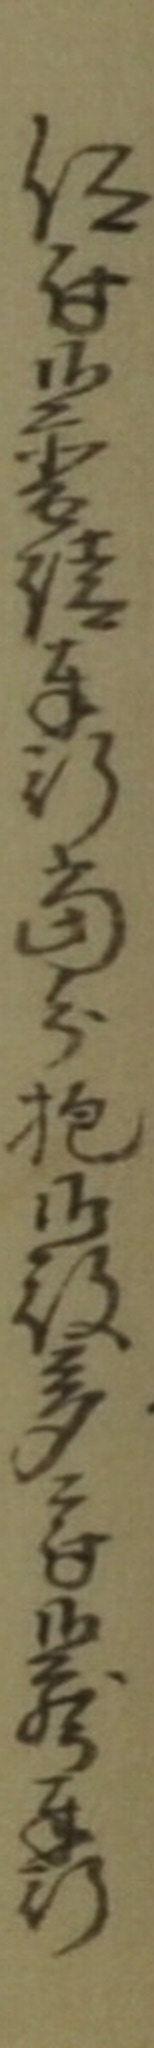仰付御普請奉行当分抱御役多ニ付御蔵奉行
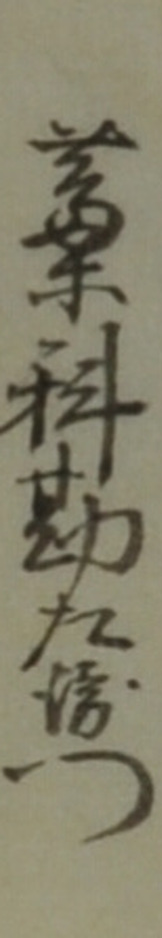藁科勘左衛門

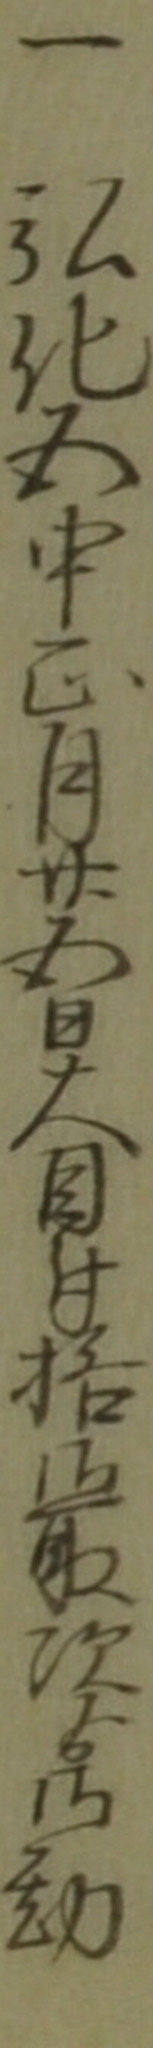一弘化五申正月廿五日大目付格御取次ゟ御勘
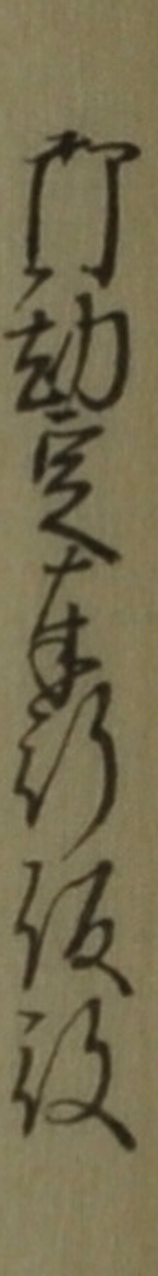御勘定奉行仮役
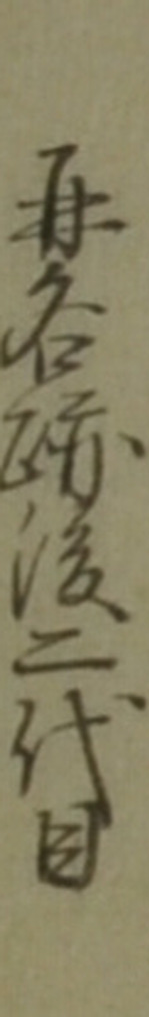再名跡後二代目
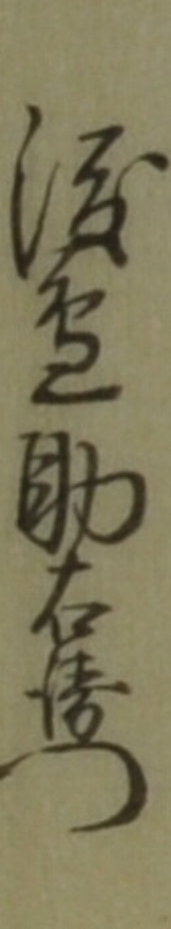渡邊助右衛門
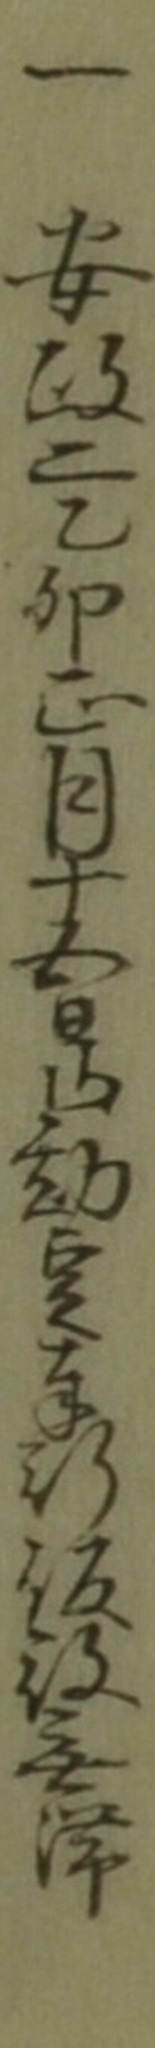一安政二乙卯正月十五日御勘定奉行仮役無滞
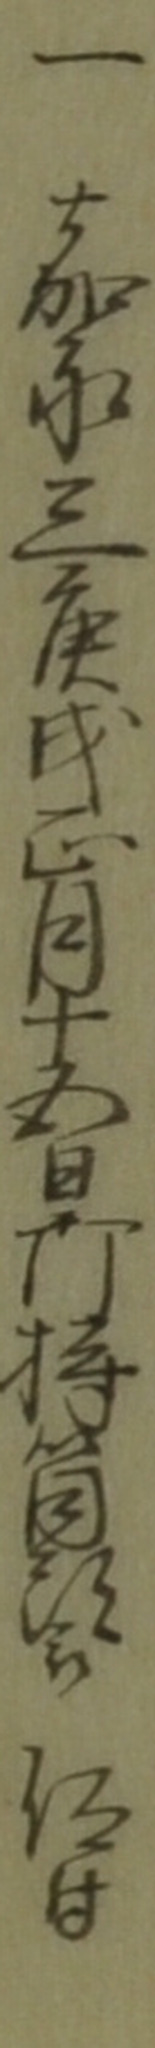一嘉永三庚戌正月十五日御持筒頭被仰付
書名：諸御役代々録（三）
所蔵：伊那市立高遠町図書館・合同会社AMANE
